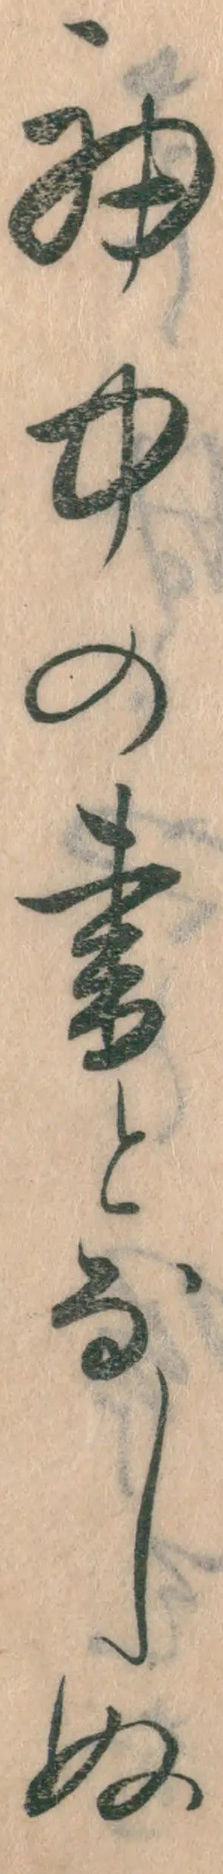袖中の書となしぬ
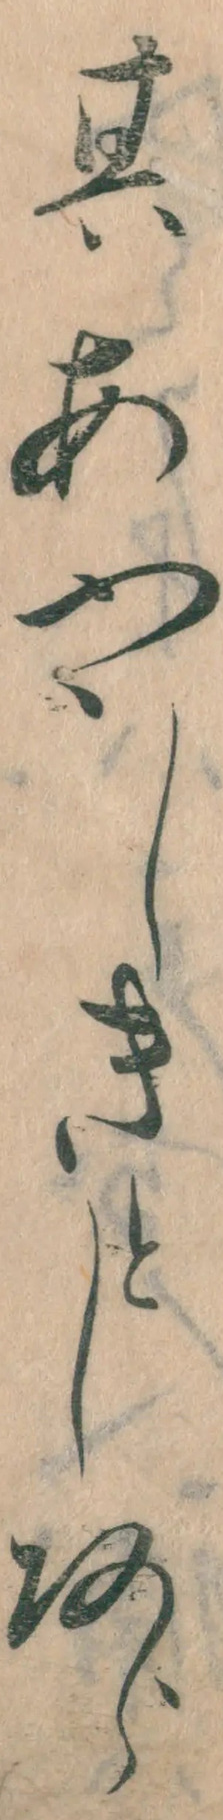其あやしきとしあら

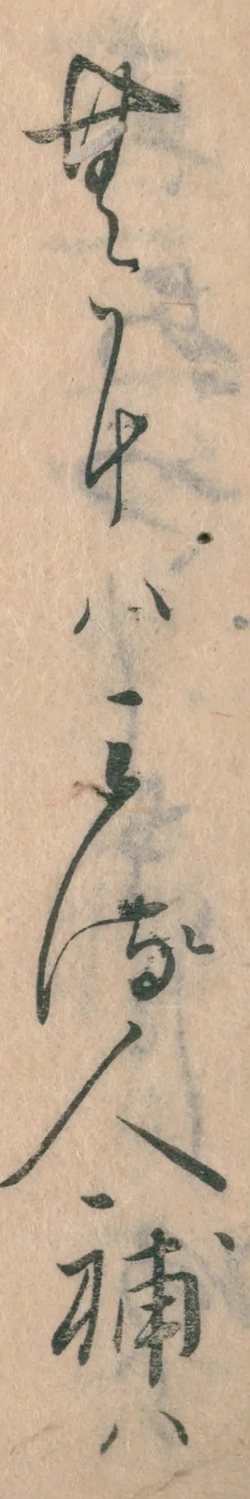むにはみる人補は
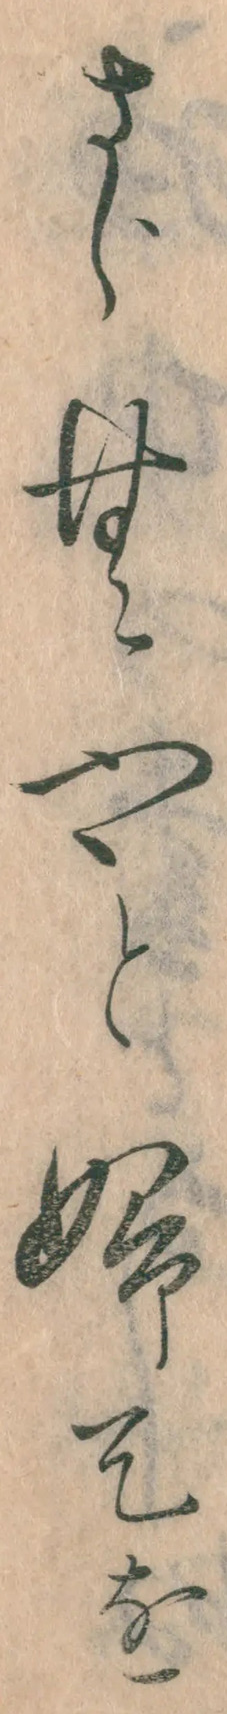さらむやとふてを
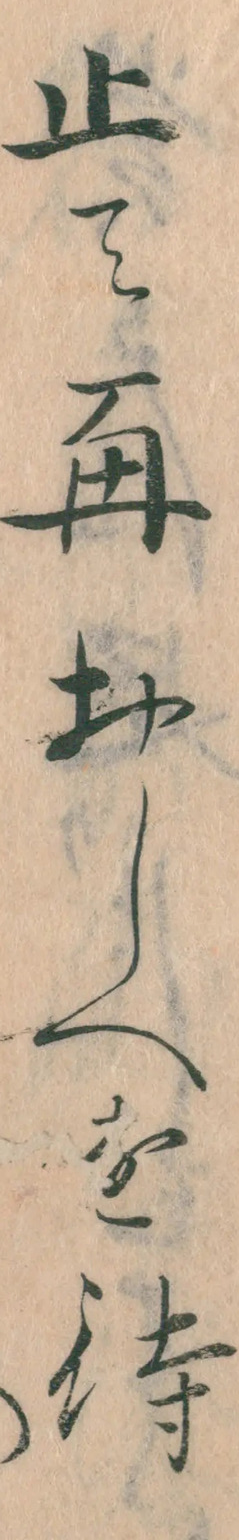止て再おしへを待
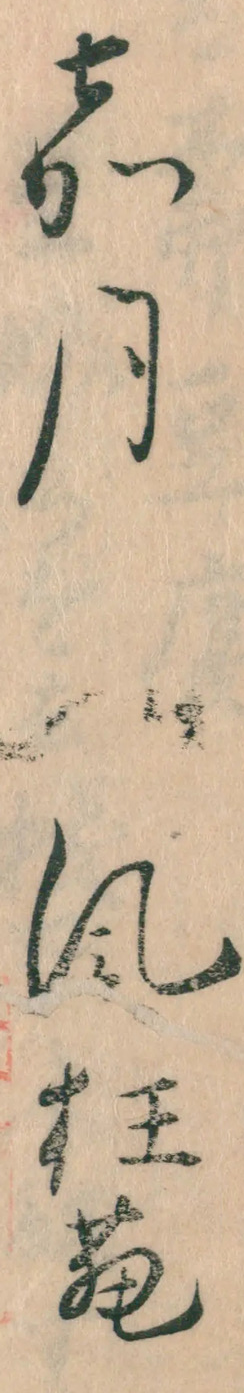嘉月風狂庵

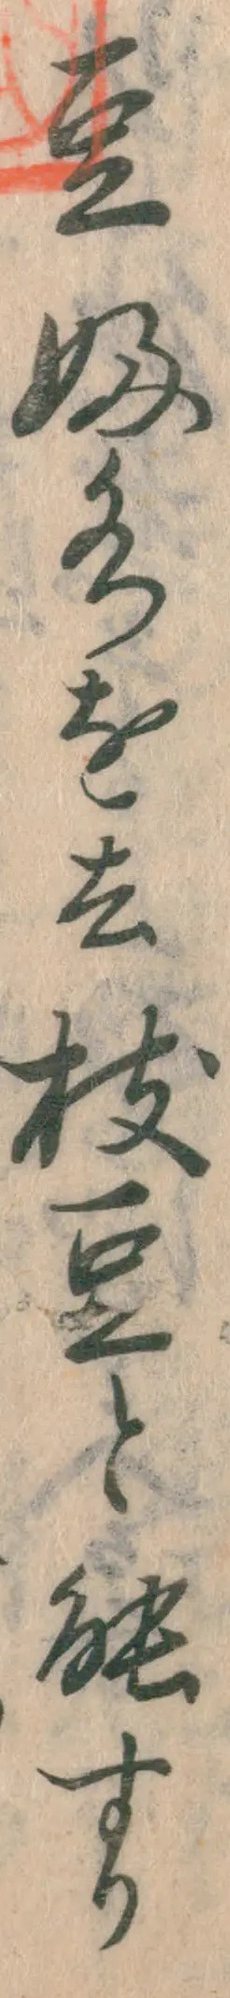豆ふ水を去枝豆と能すり
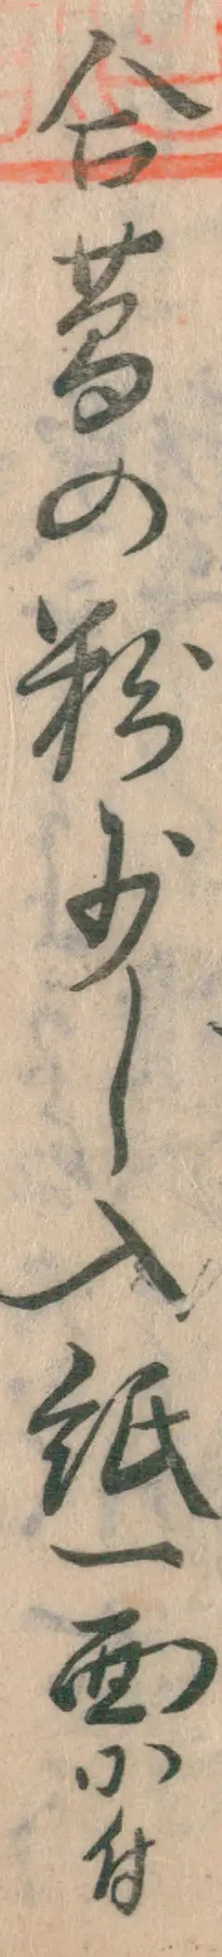合葛の粉少し入紙一面に付
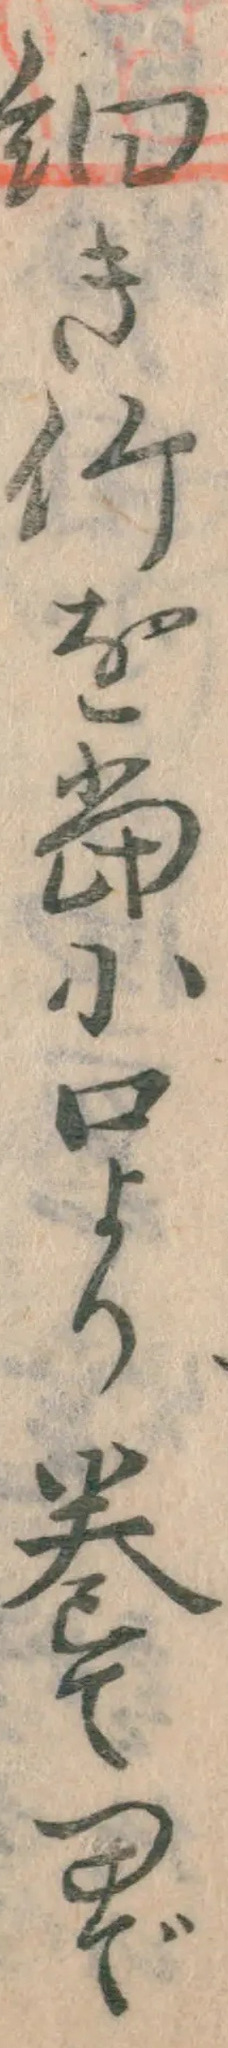細き竹を当小口より巻てゆで
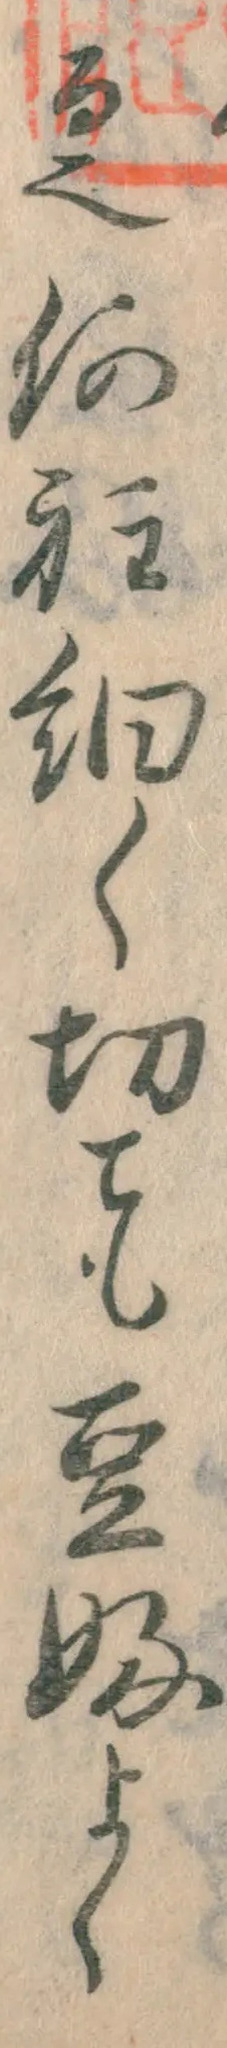る也何程細く切ても豆ふよく
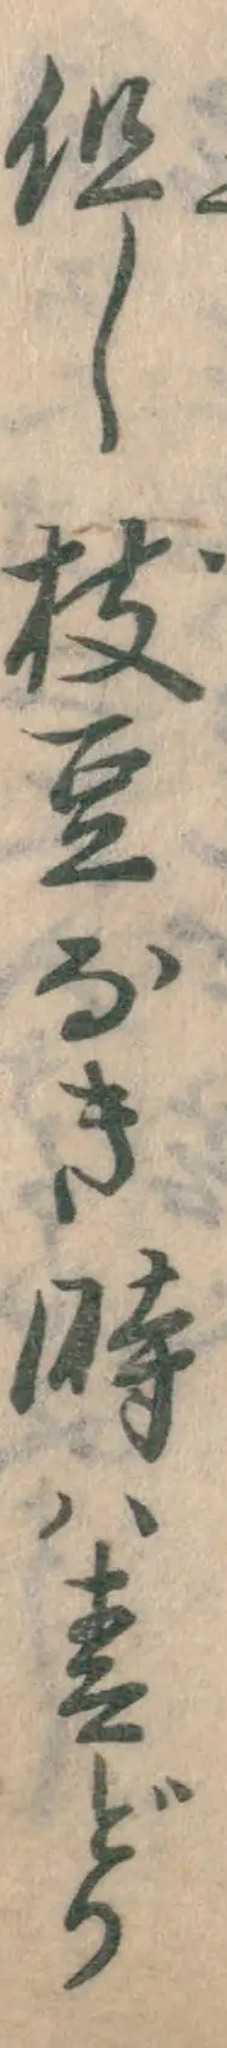但し枝豆なき時は青どり
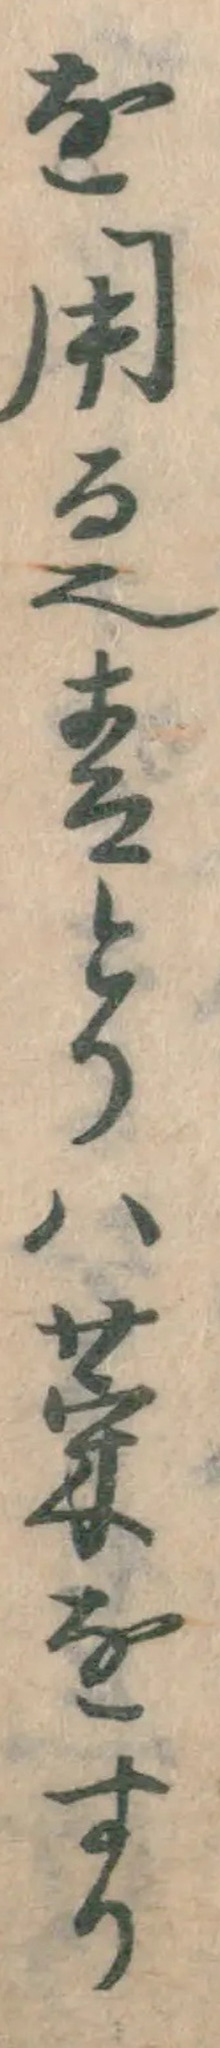を用る也青とりは菜をすり

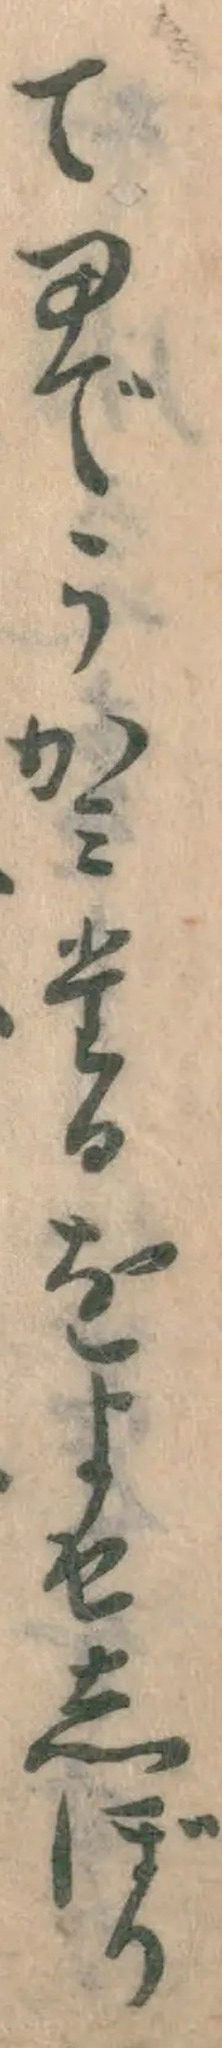てゆでうかみたるをよせしぼり
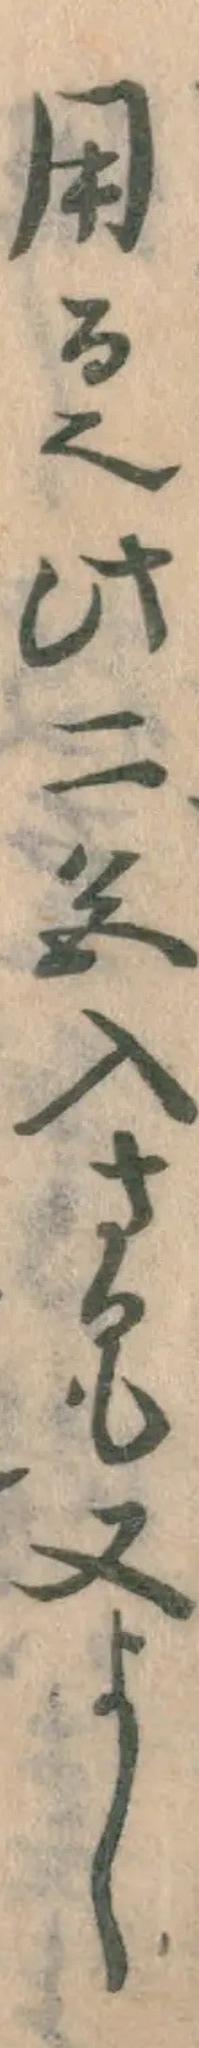用る也此二色入さるも又よし
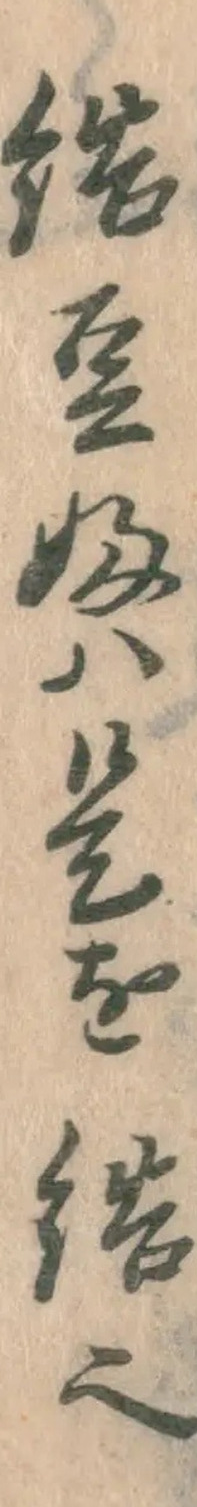結豆ふは是を結也
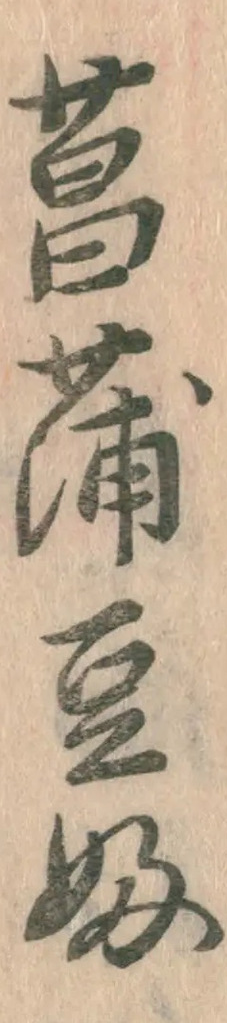菖蒲豆ふ
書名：豆腐百珍余録
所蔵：国立国会図書館 National Diet Library, JAPAN
